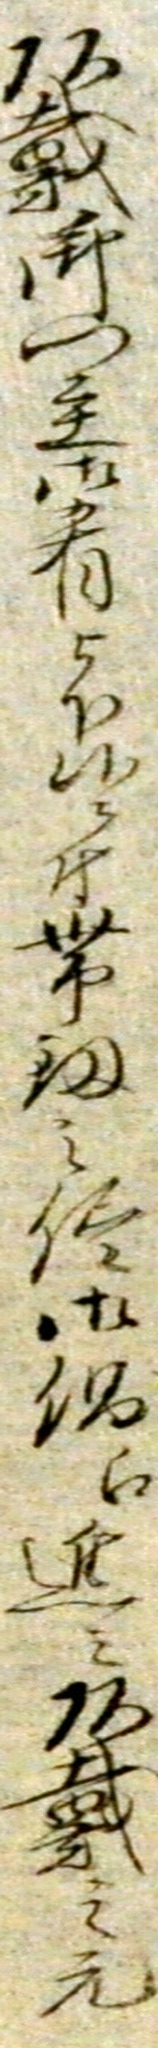頂戴御門主御肴ヒ下候ニ付帯劔之儘御側江進ミ頂戴之元
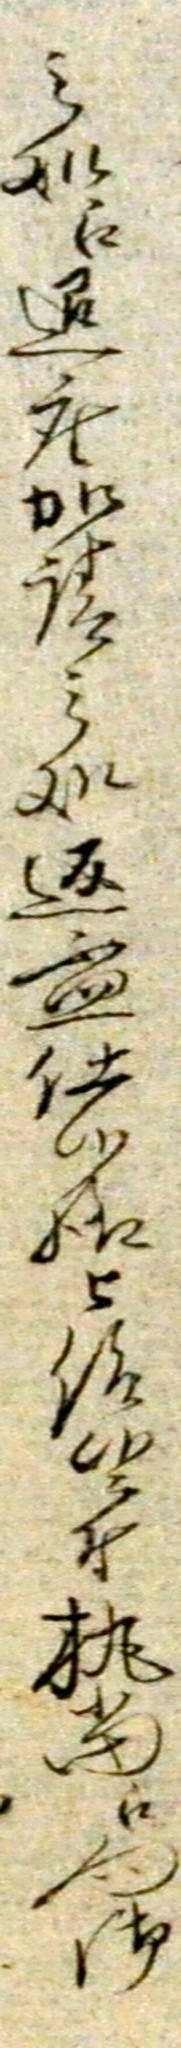之処江退座加請之処返盃仕候様ヒ仰候ニ付執當江向御
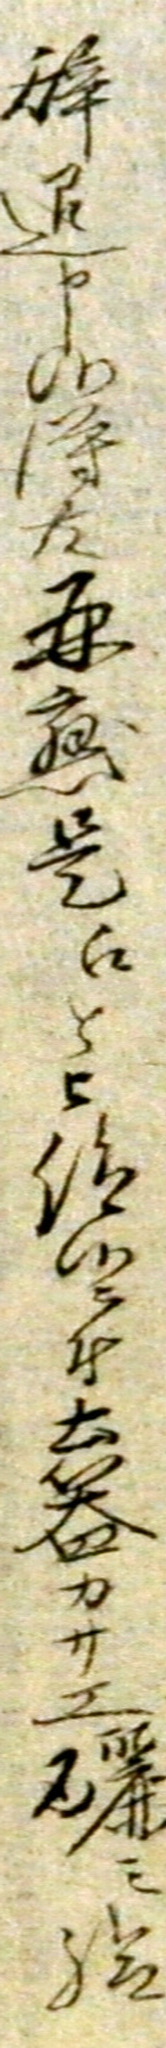辞退申候得共再応是江とヒ仰候ニ付土器カサエ酉麗給仕
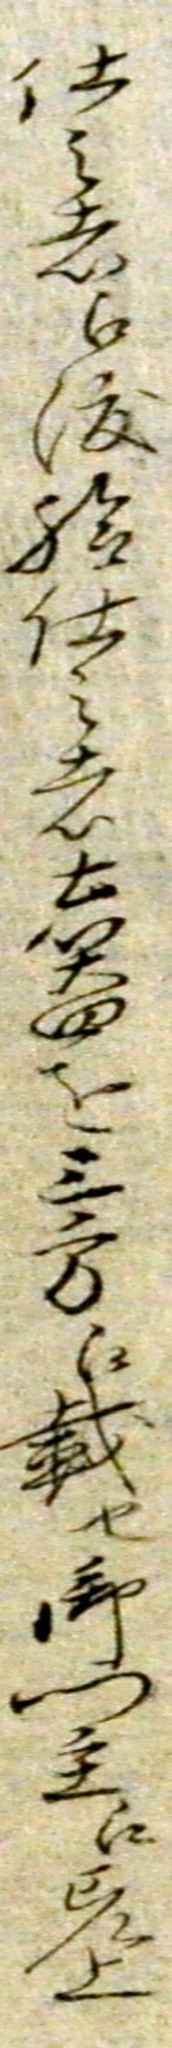仕之者江渡給仕之者土器を三方乗セ御門主江差上
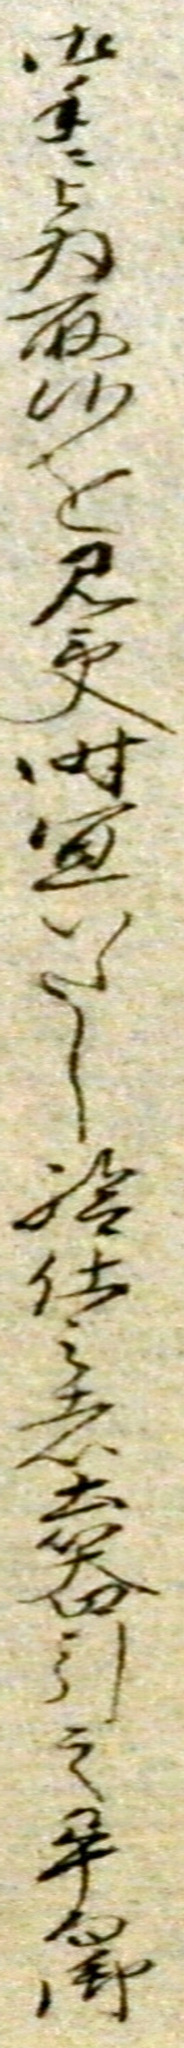御手二ヒ為取候を見受時宜いたし給仕之者土器引之畢る御
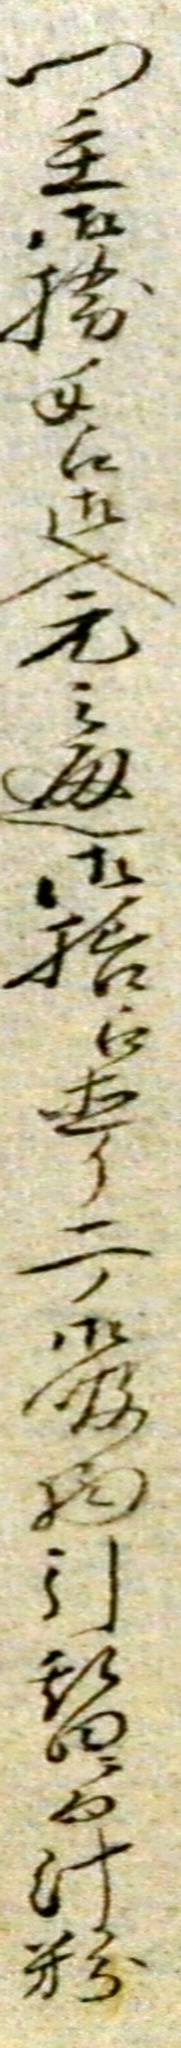門主御勝手江御入り元之通御膳江直り二ノ御吸物引替ニ而
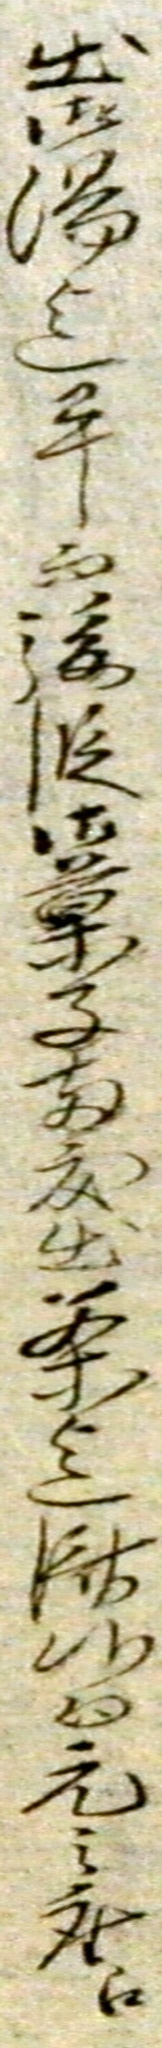汁粉出御湯迄畢而後段御菓子両度出茶迄済候而元之座江
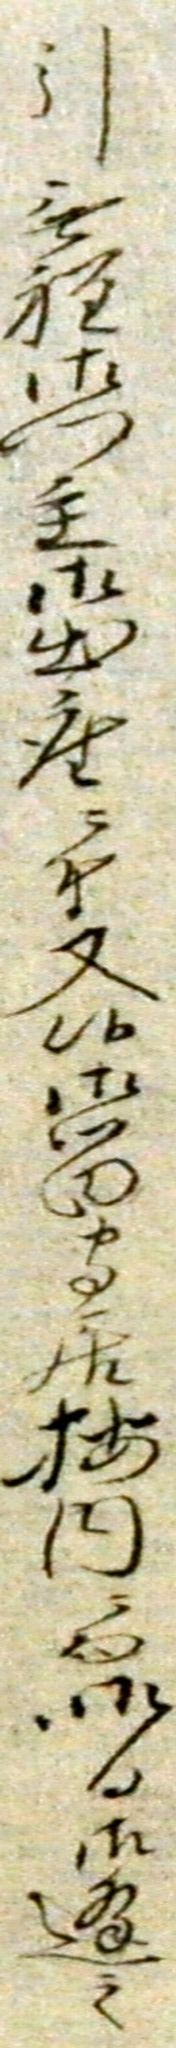引無程御門主御出座ニ付又候御留守居按内ニ而昨日御逢
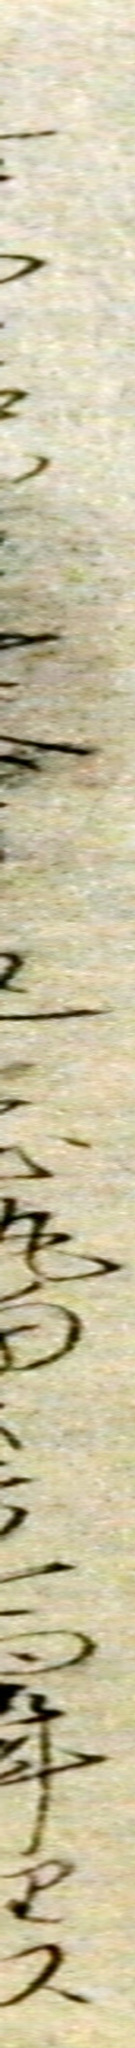通御敷居際ニ而着座夫ゟ前之通罷出執當之方を向御料理頂

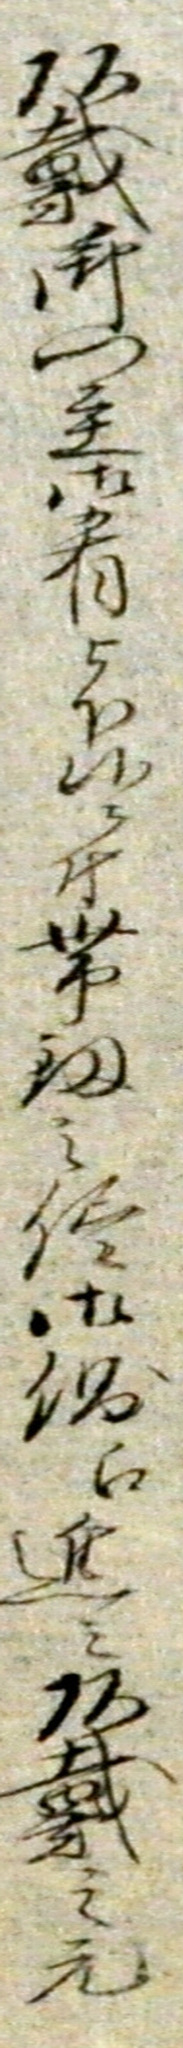頂戴御門主御肴ヒ下候ニ付帯け之侭御側江進頂戴之元
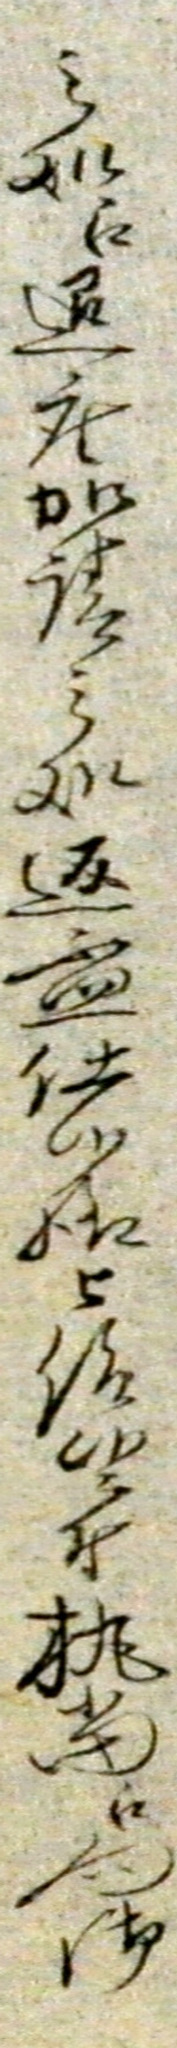之処江退座加請之処返盃仕候様ヒ仰候ニ付執當江向御
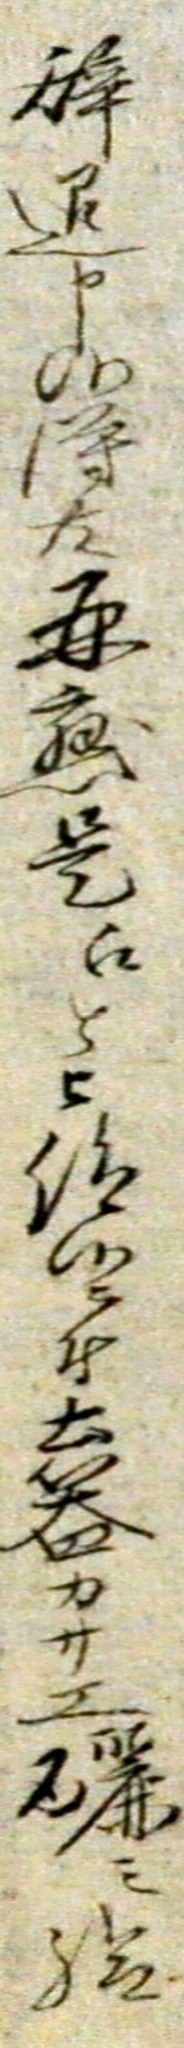辞退申候得共再応是江とヒ仰候二而土器カサエ酉麗之給
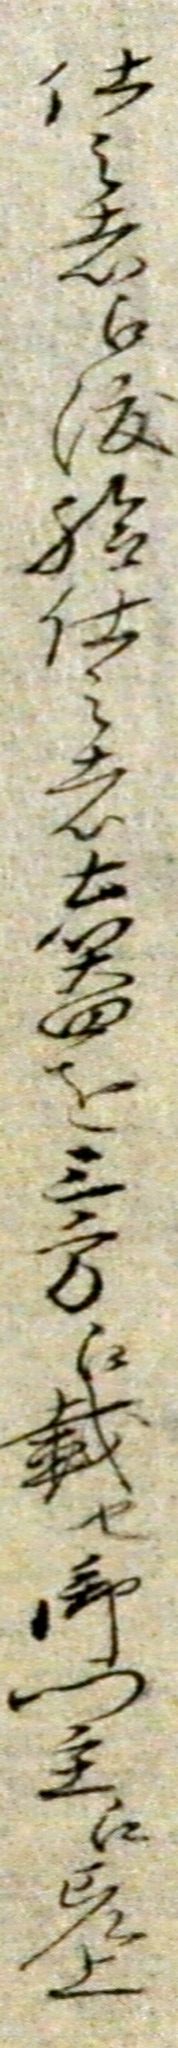仕之者渡給仕之者土器を三方江載御門主江差上
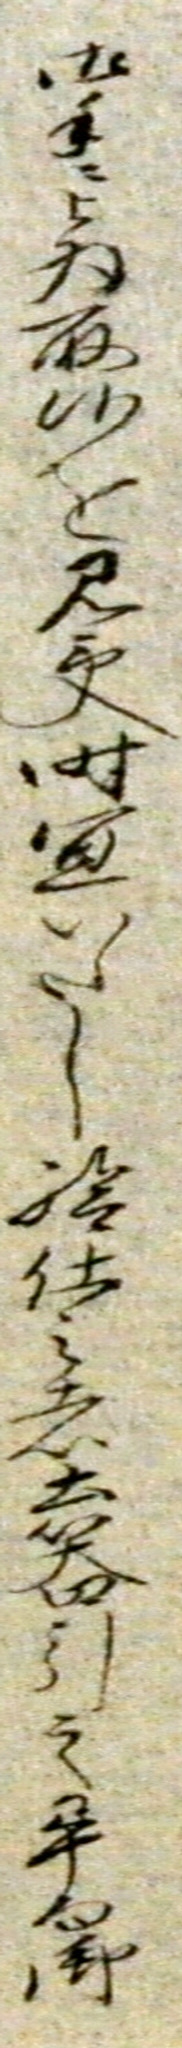御手二ヒ為取候を見受時宜いたし給仕之者土器引之畢御
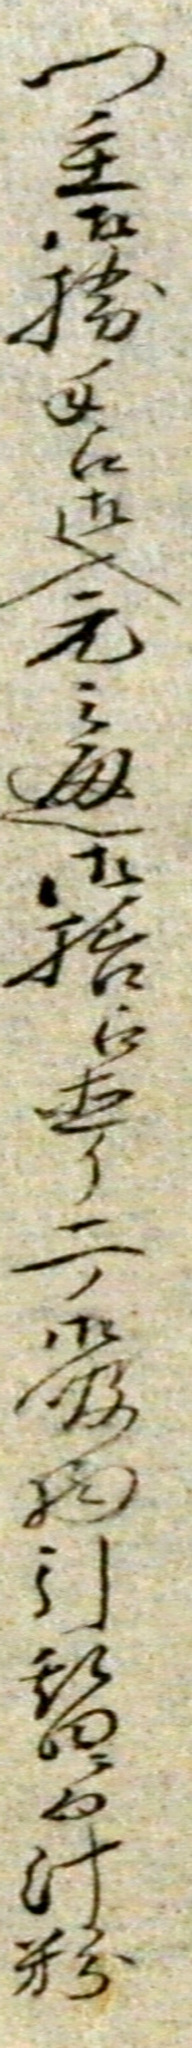門主御勝手江御入元之通御膳江直り二ノ御吸物引替汁粉
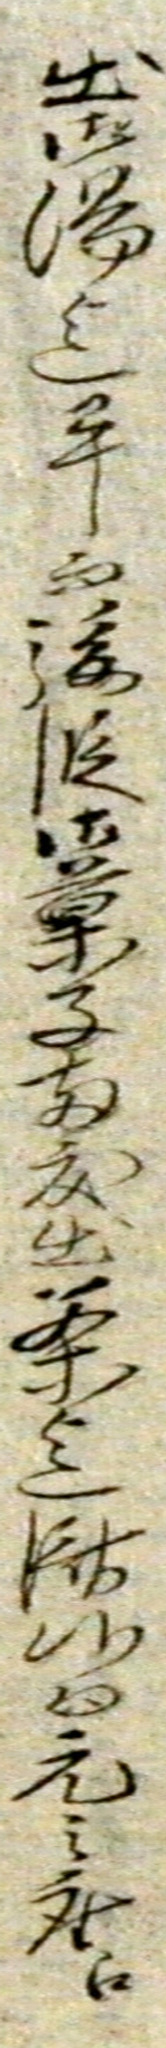出御湯迄畢而後段御菓子両度出茶迄済候而元座江
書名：日光御名代相勤候節ノ留
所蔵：伊那市立高遠町図書館・合同会社AMANE
